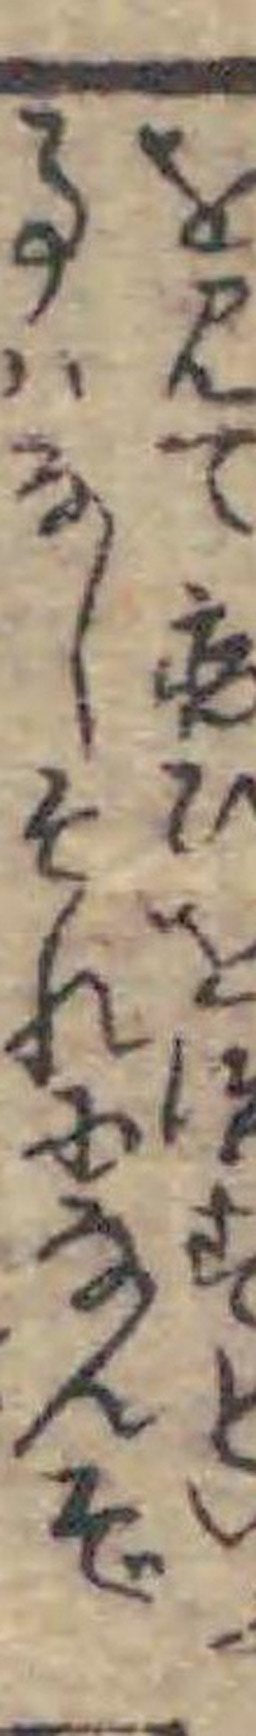事はなしそれになんぞ
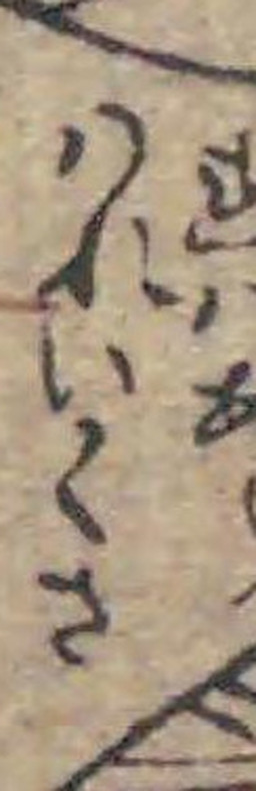はれいくさ
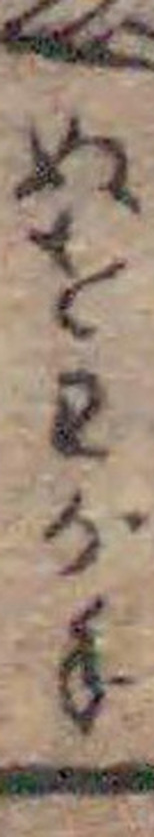ぬをわが手
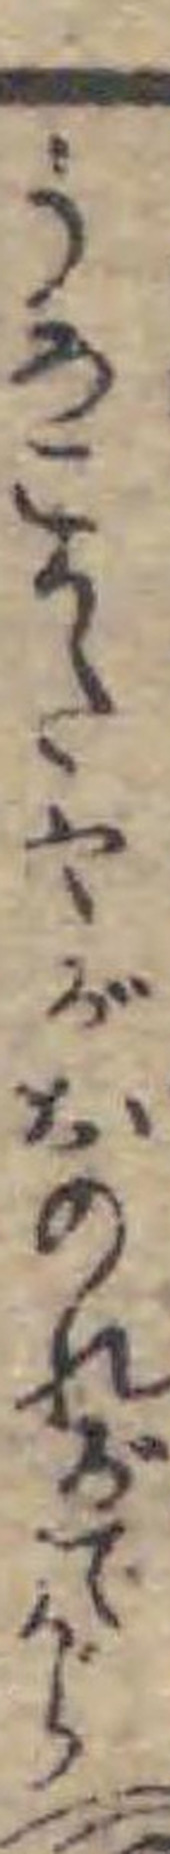うろこかたやがおのれがてがら
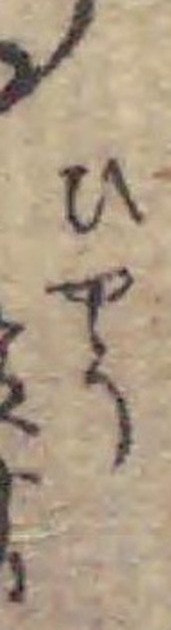ひやう
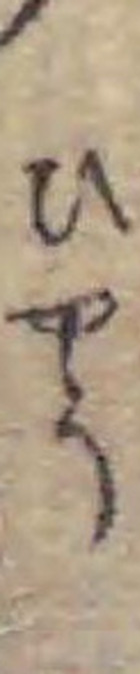ひやう
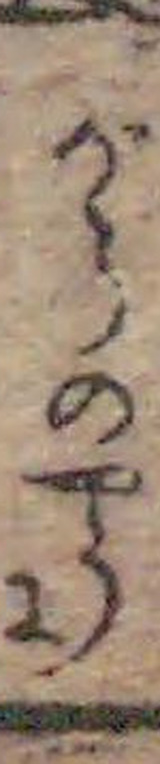がらのやう
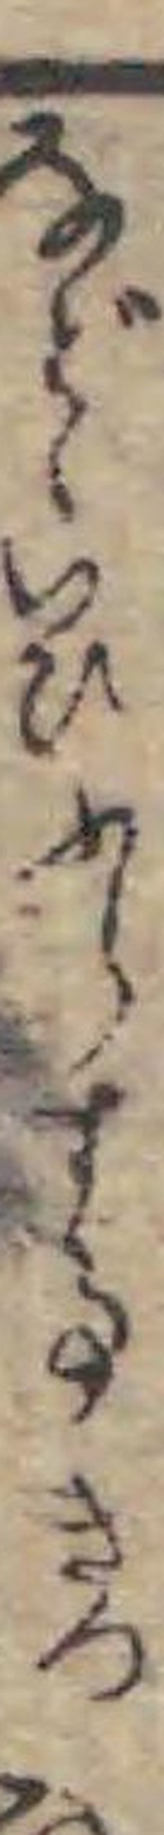などゝいひふらす事きつ
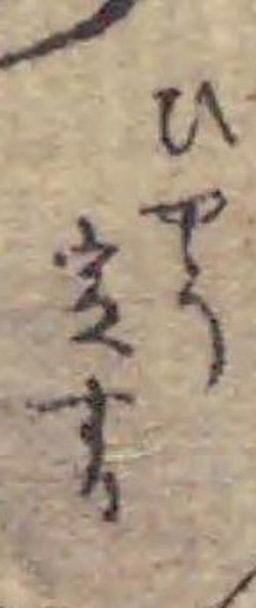定する
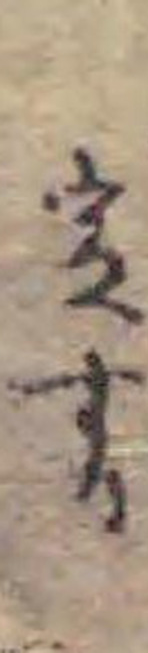定する
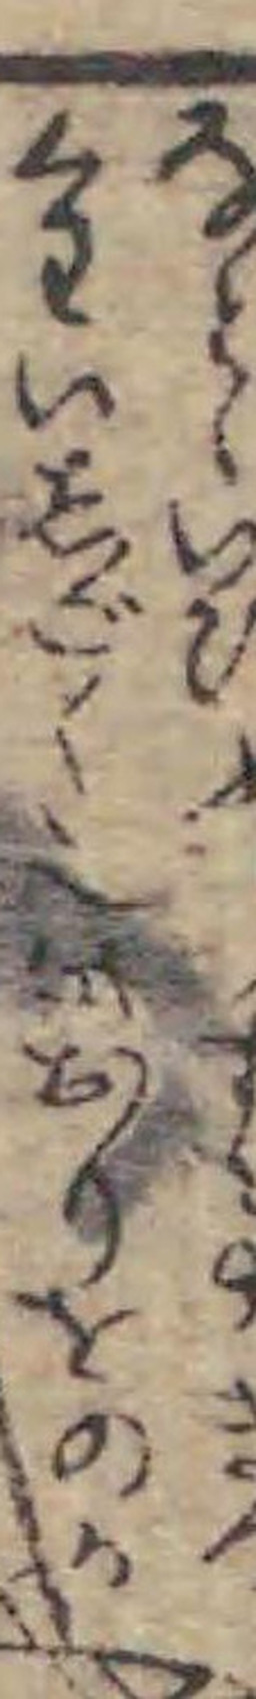くわいしごく也此おりをのか
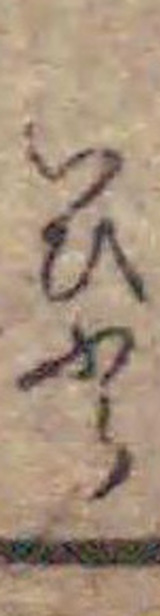いひふら
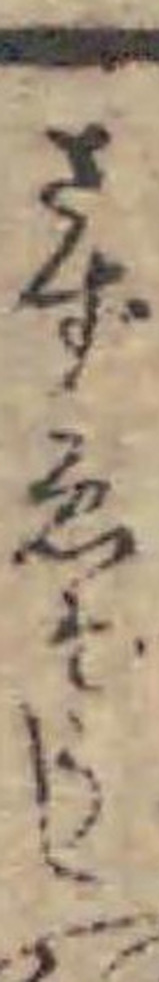さずゑぞうし
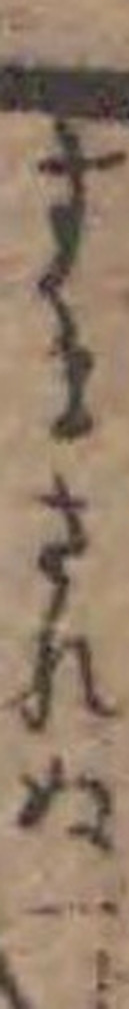すまされぬ
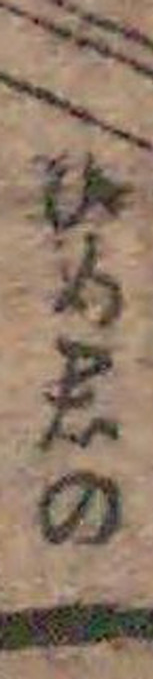ひめ君の
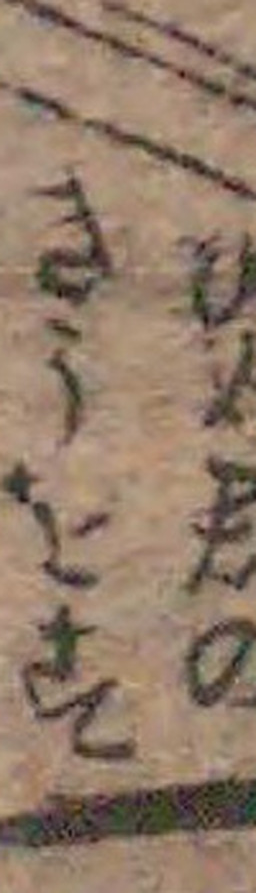きうをす
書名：三舛増鱗組 : 3巻
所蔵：国立国会図書館 National Diet Library, JAPAN
